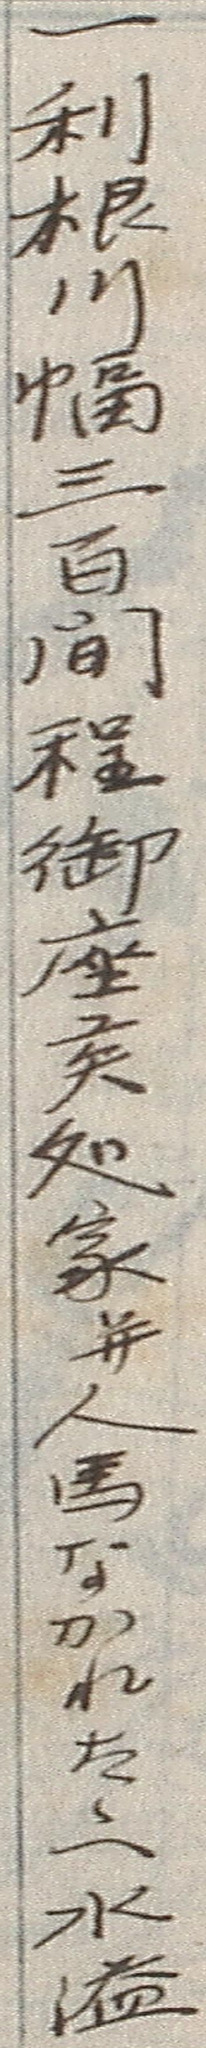一利根川幅三百間程御座候処家并人馬なかれたゝへ水溢
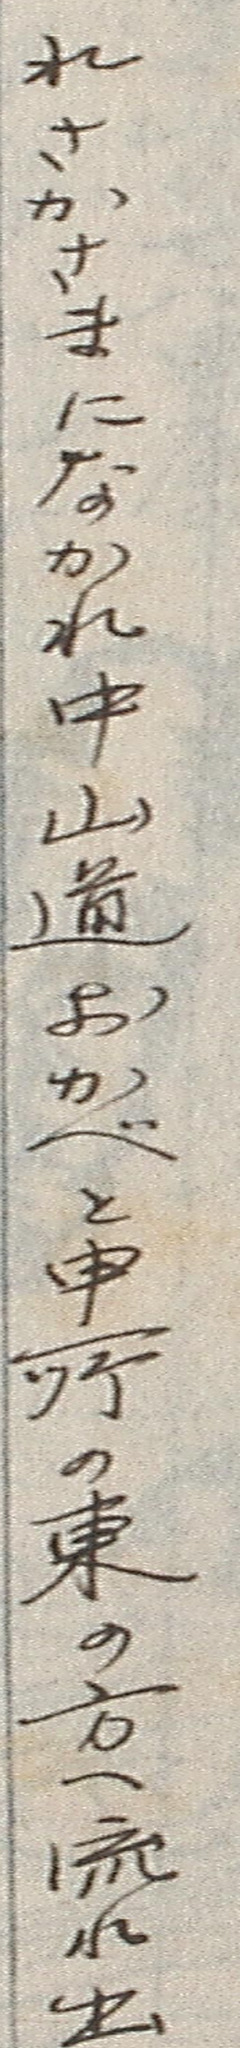れさかさまになかれ中山道おかべと申所の東の方へ流れ出
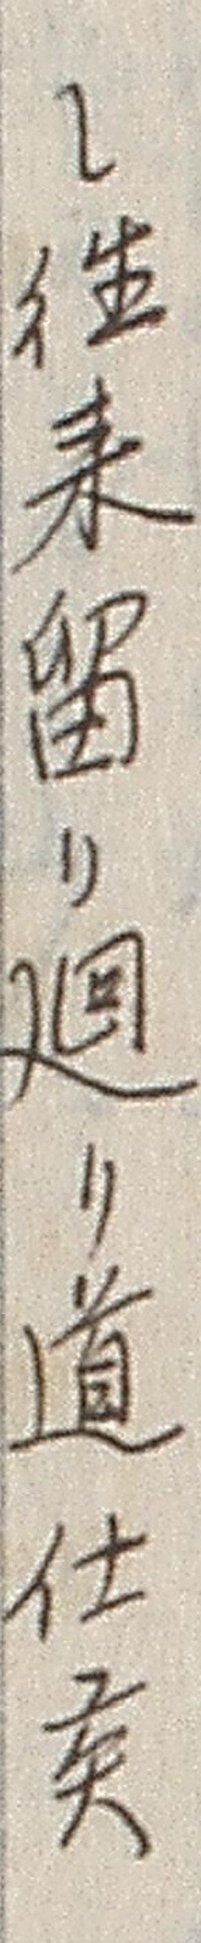し往来留り廻り道仕候
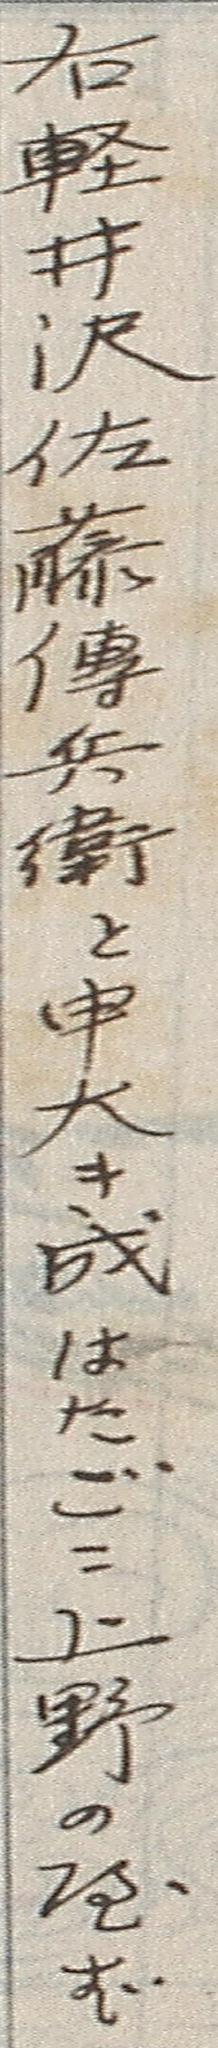右軽井沢佐藤伝兵衛と申大き成はたごに上野のやば
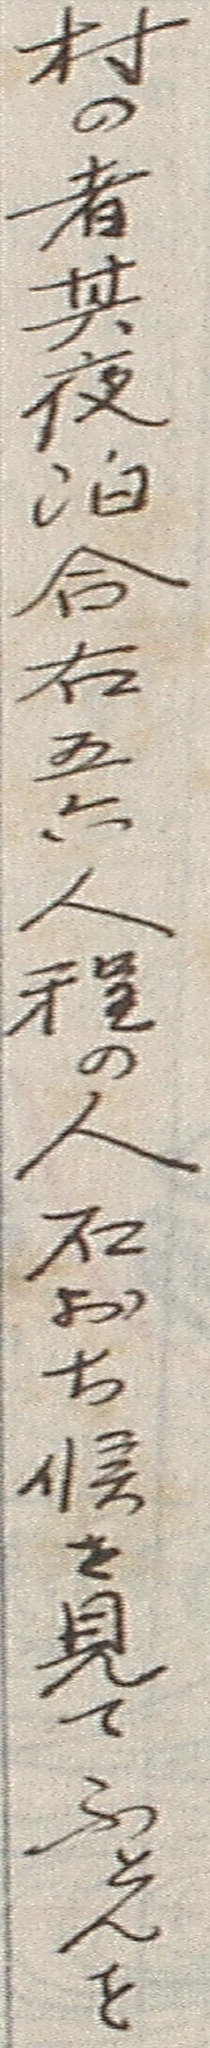村の者其夜泊合右五六人程の人石おち候を見てふとんを
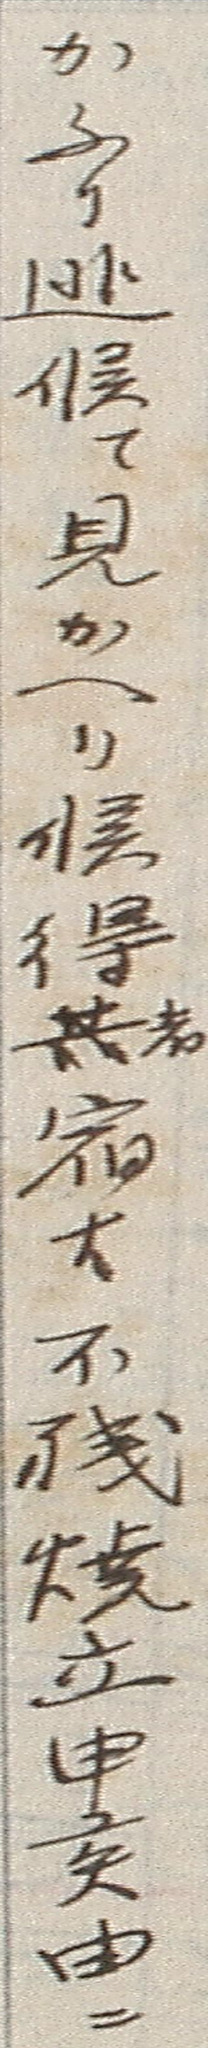かふり逃候て見かへり候得者宿は不残焼立申候由に
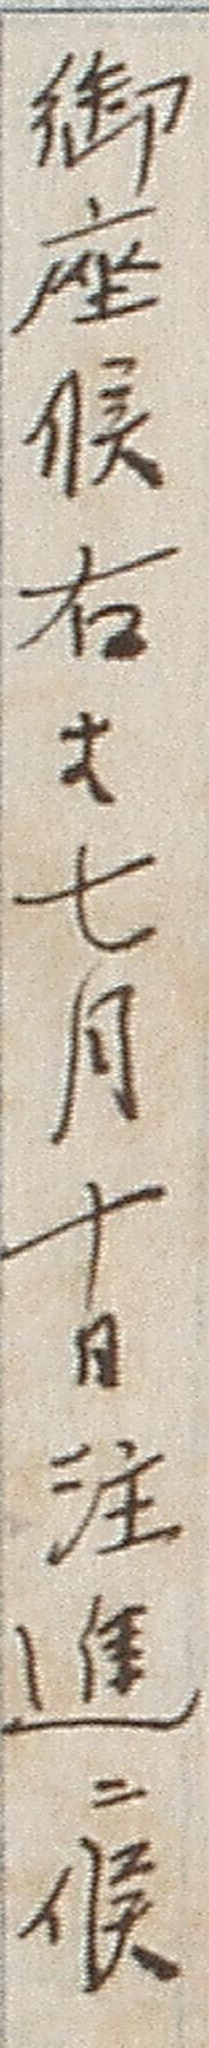御座候右は七月十日注進に候

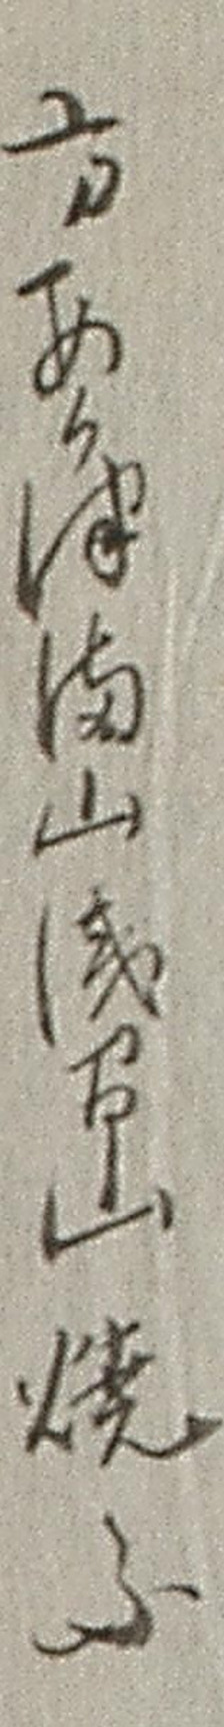方」あかつま山浅間山焼ふ
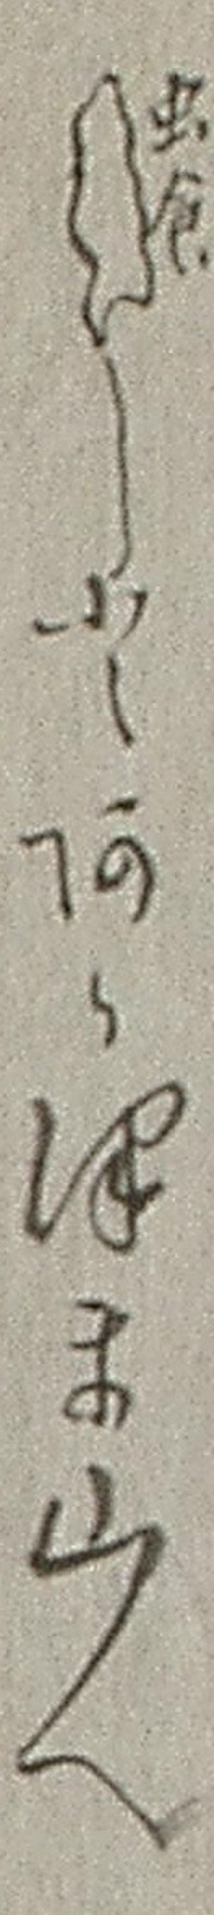口口とあかつま山へ
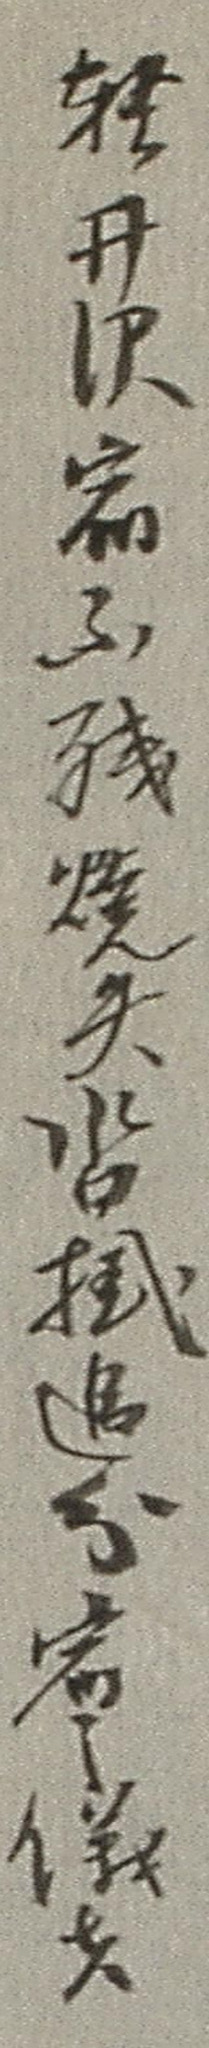軽井沢宿不残焼失沓掛追分宿之儀は
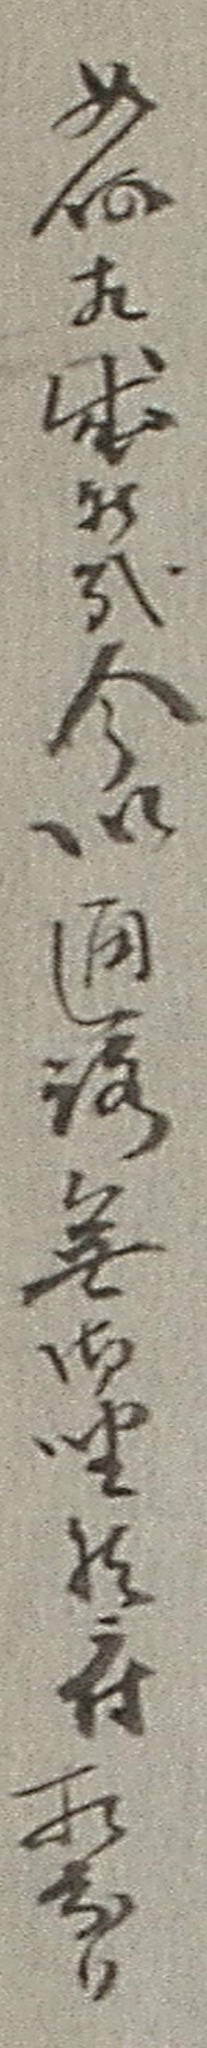如何相成候哉今以通路無御座候二付相分り
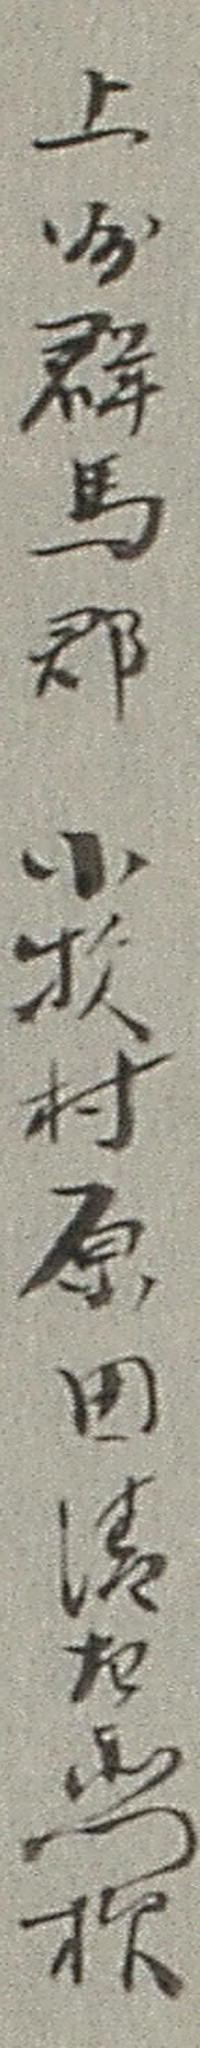上州群馬郡小牧村原田清左衛門様
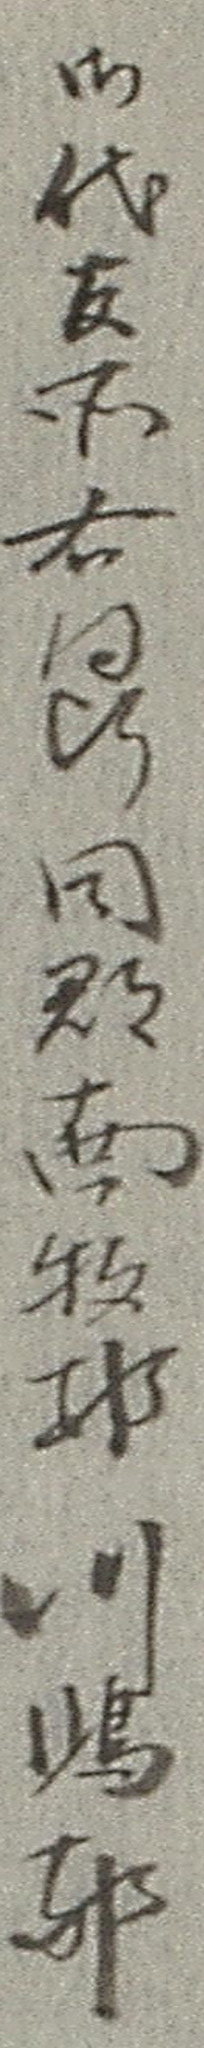御代官所右同断同郡南牧邨川嶋邨
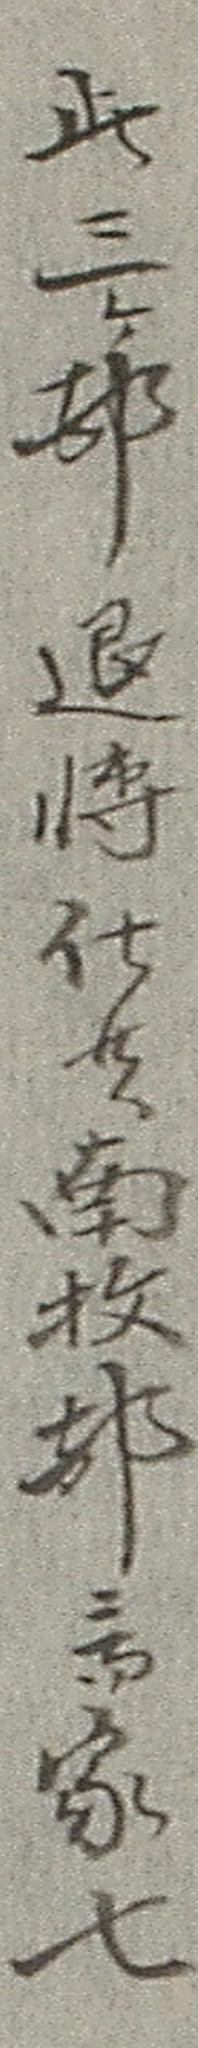此三ヶ邨退転仕候南牧邨二而家七
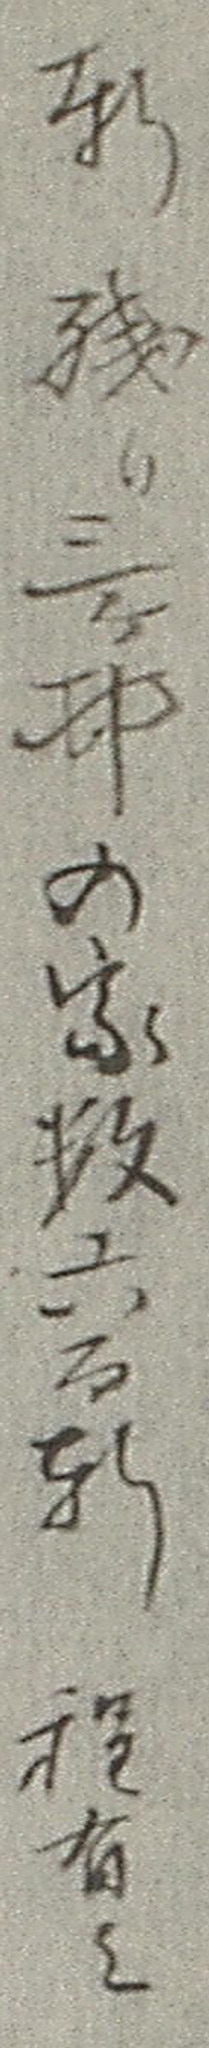軒残り三ヶ邨の家数六百軒程有之
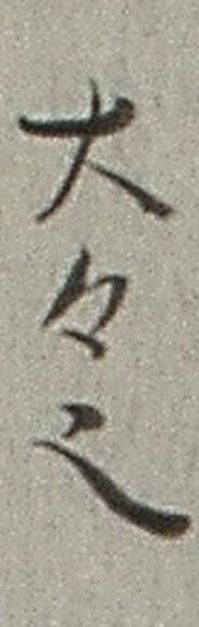大々也
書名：浅間山焼出記
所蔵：東京大学地震研究所図書室 Earthquake Research Institute Library, The University of Tokyo, JAPAN
